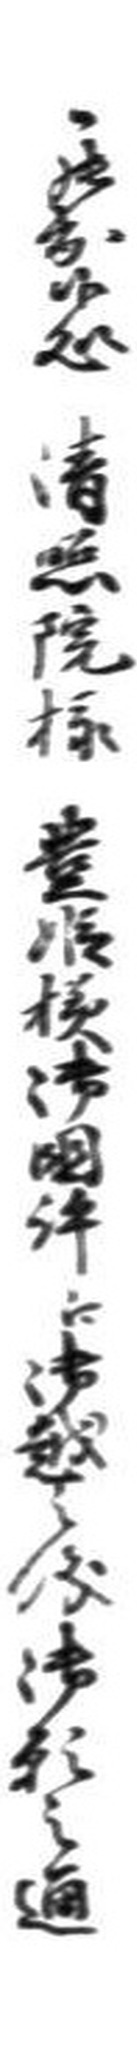罷出候処清照院様豊姫様御国許江御越之儀御願之通

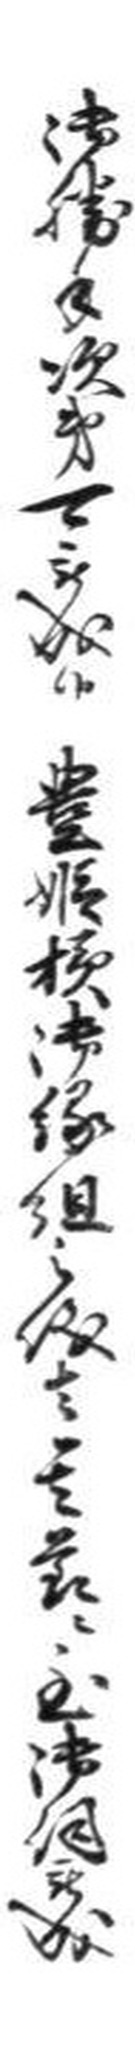御勝手次第可被成候豊姫様御縁組之儀者其節ニ至御伺被成
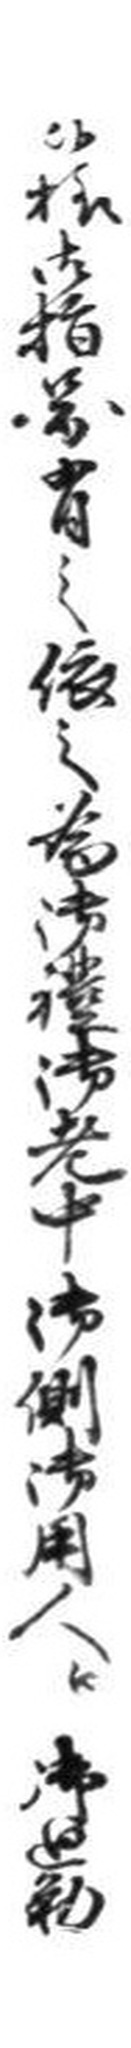候様御指図有之依之為御礼御老中御側御用人江御廻勤
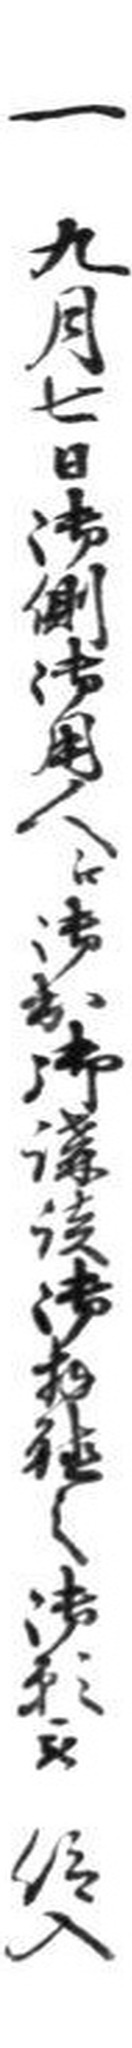一九月七日御側御用人江御出御購読御拝聴之御願被仰入
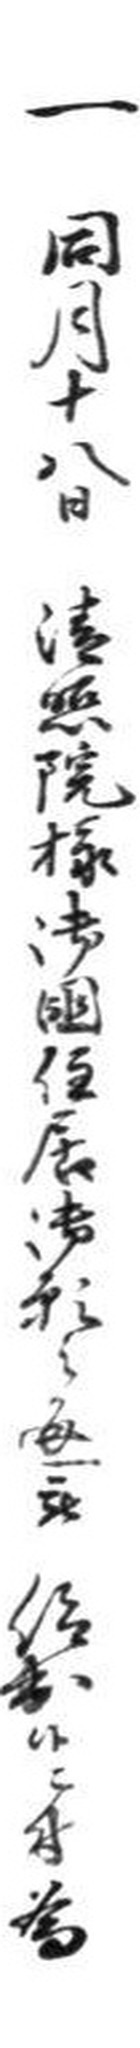一同月十八日清照院様御国住居御願之通被仰出候ニ付為
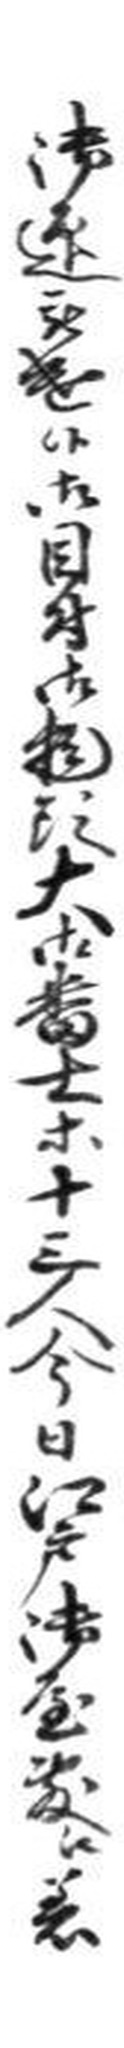御迎被遣候御目付御物頭大御番士等十三人今日江戸御屋敷江着
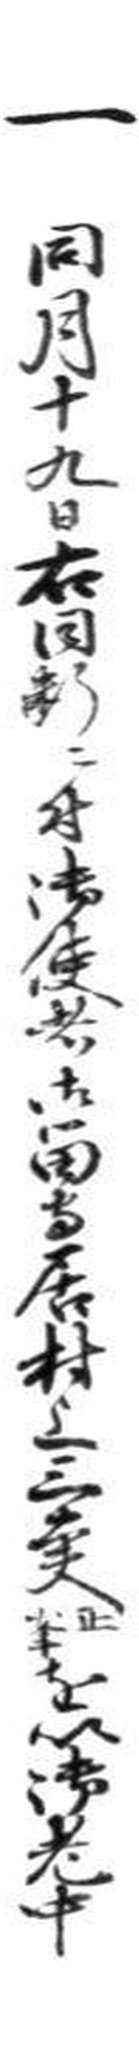一同月十九日右同断ニ付御使者御留守居村上三太夫正峰を以御老中
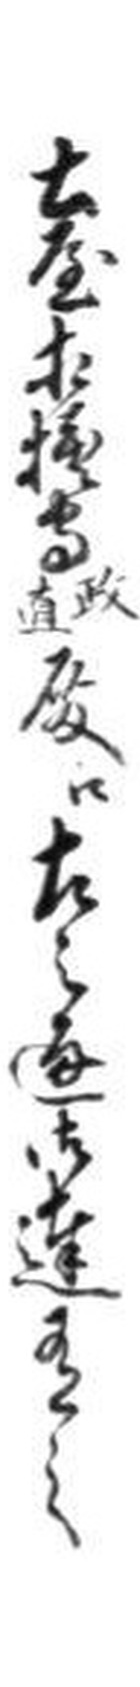土屋相模守政直殿江左之通御達有之
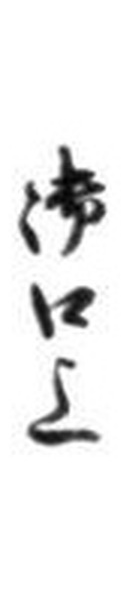御口上
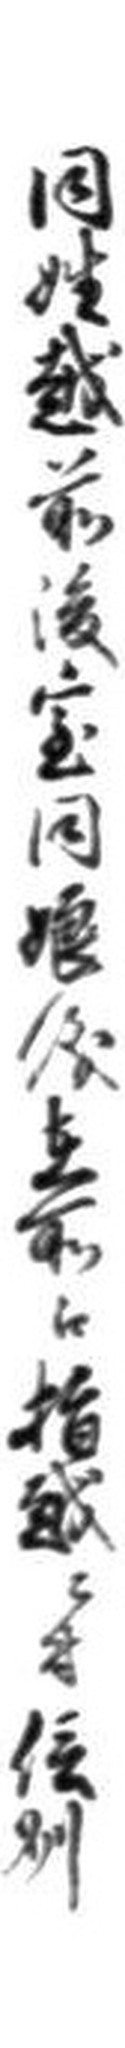同姓越前後室同娘儀在所江指越ニ付信州
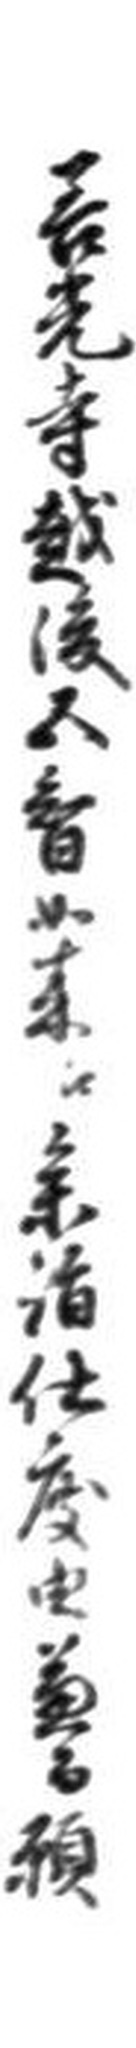善光寺越後五智如来江参詣仕度由兼而願
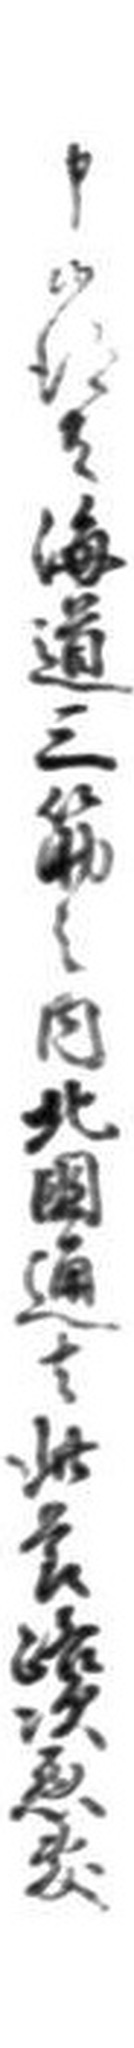申候得共海道三筋之内北国道者此節路次悪敷
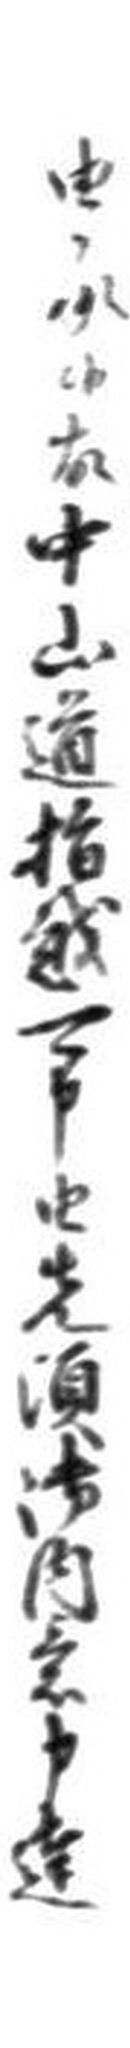由承候故中山道指越可申由先頃御内意申達
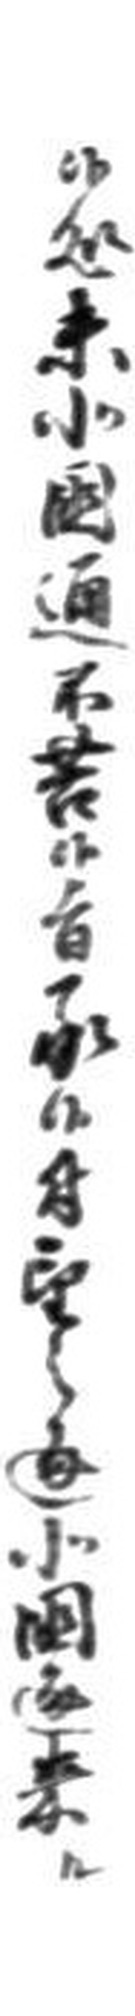候処未北国通不苦候旨承候付望之北国通来ル
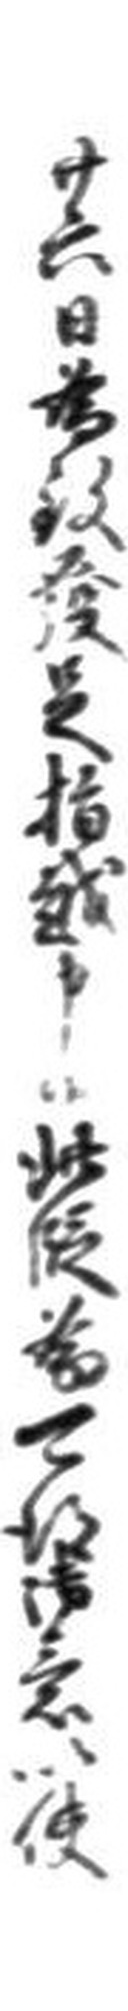廿六日為致発足指越申候此段為可得御意以使
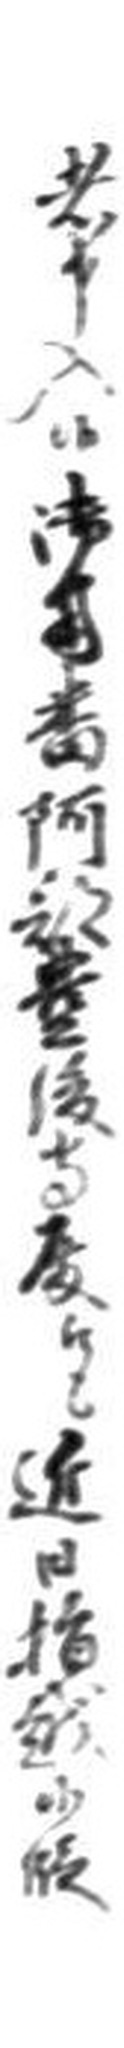者申入候御用番阿部豊後守殿江も近日指越候段
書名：家譜 二十一 吉品公 従元禄十三年到同十四年
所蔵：福井県文書館 Fukui Prefectural Archives
